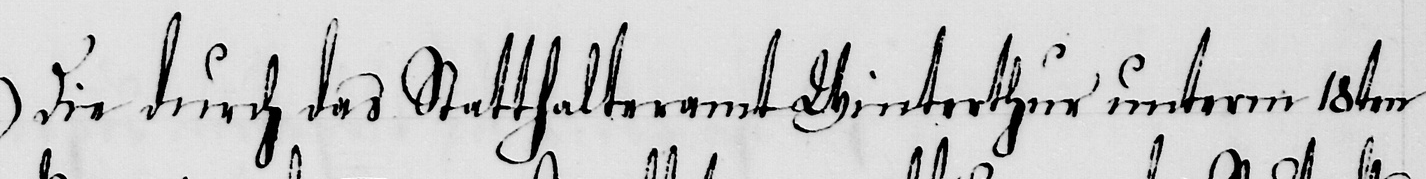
Die durch das Statthalteramt Winterthur unterm 18ten
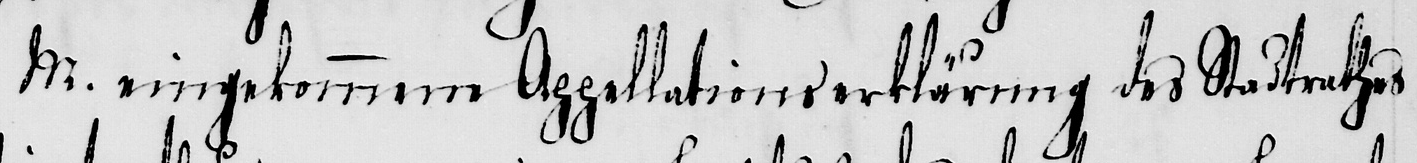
M. eingekommene Appellationserklärung des Stadtrathes
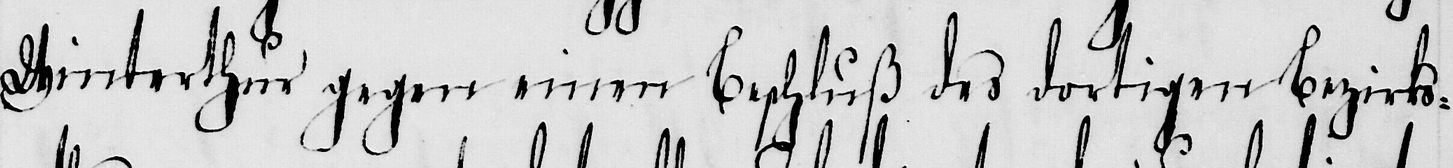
Winterthur gegen einen Beschluß des dortigen Bezirks¬
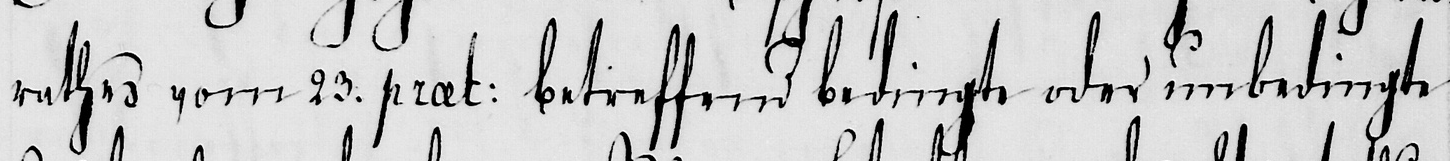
rathes vom 23. prat: betreffend bedingte oder unbedingte
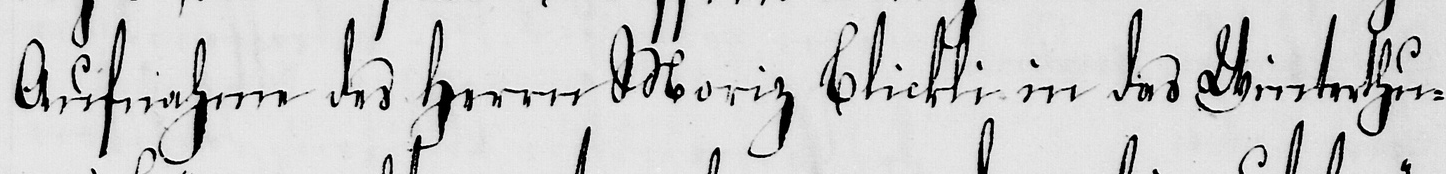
Aufnahme des Herrn Moriz Blickli in das Winterthu¬
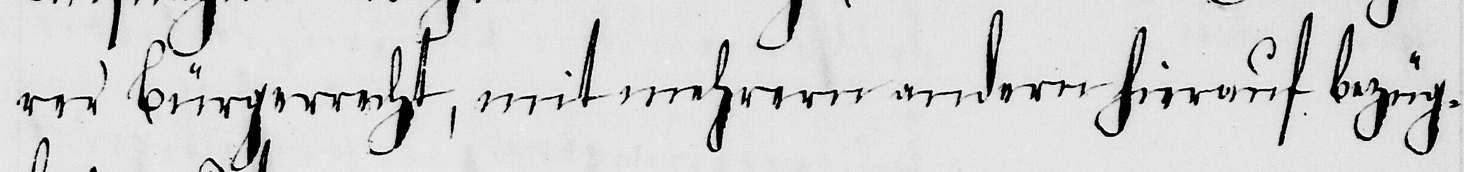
rer Bürgerrecht, mit mehrern andern hierauf bezüg¬
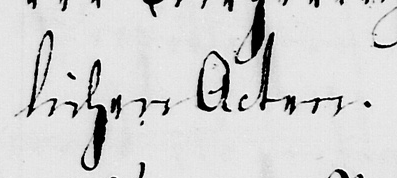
lichen Acten.
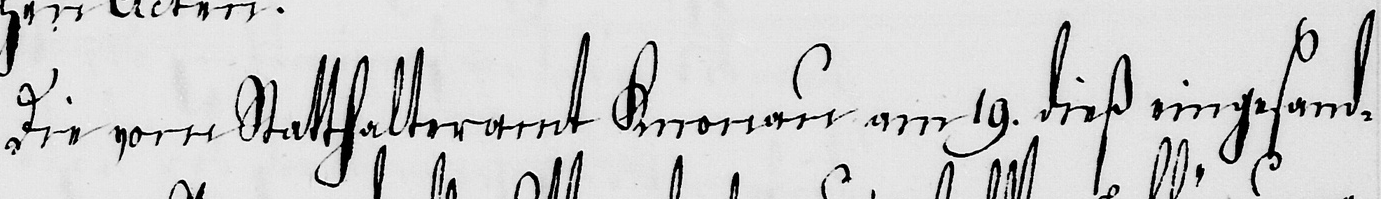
Die vom Statthalteramt Knonau am 19. dieß eingesand¬
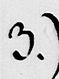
3.)
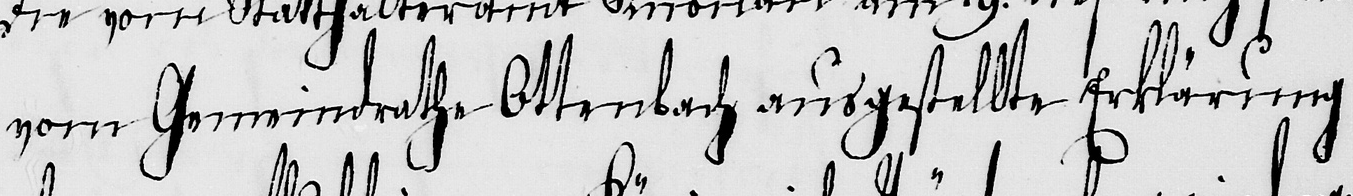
vom Gemeindrathe Ottenbach ausgestellte Erklärung
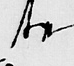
te,
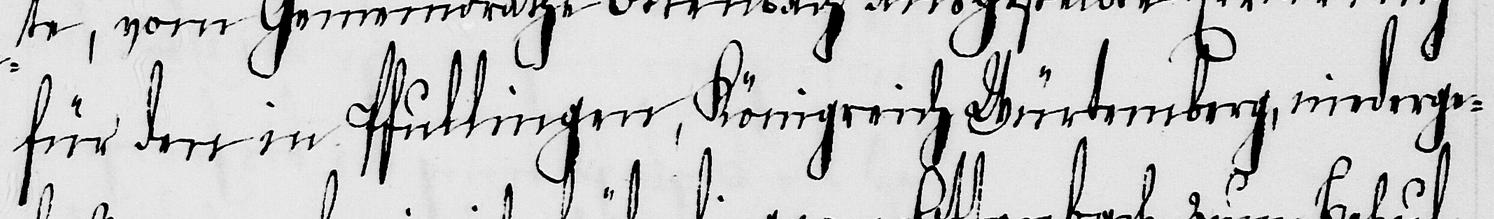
für den in Pfullingen, Königreich Würtemberg, niederge¬
